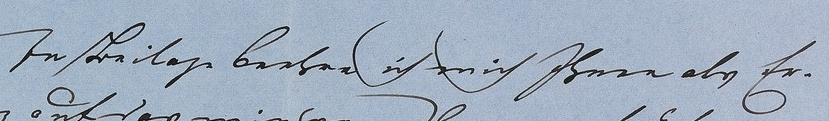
In Beilage beehre ich mich Ihnen als Er-
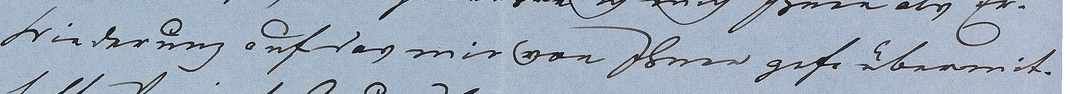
wiederung auf das mir von Ihnen gef. übermit-
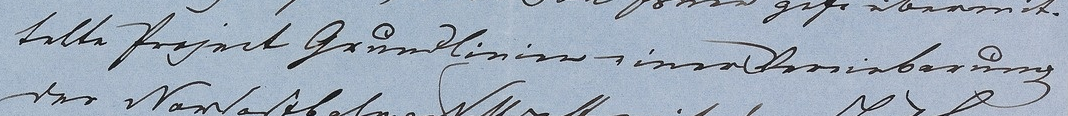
telte Project Grundlinien einer Vereinbarung
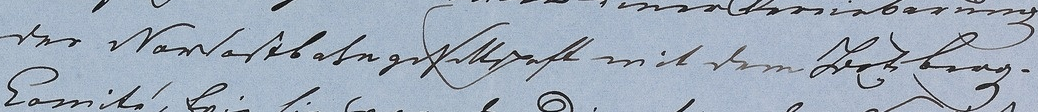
der Nordostbahngesellschaft mir dem Bötzberg-
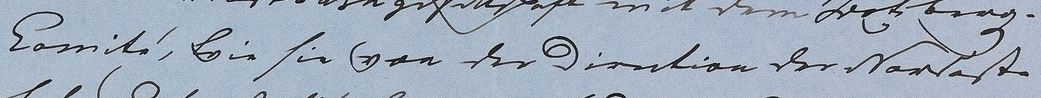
Comité, wie sie von der Direction der Nordost-
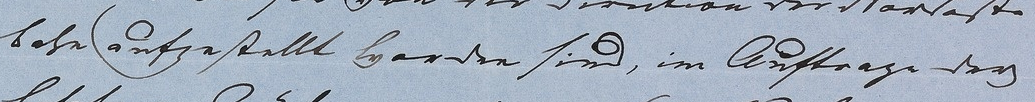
bahn aufgestellt worden sind, im Auftrage der
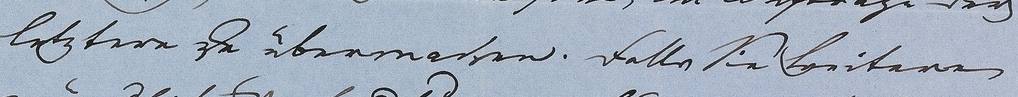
letztern zu übermachen. Falls Sie weitere
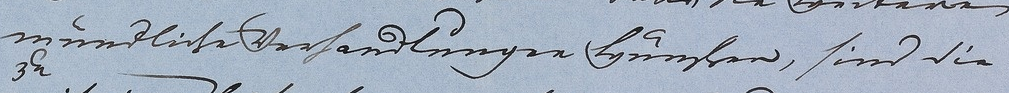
mündliche Verhandlungen wünschen, sind die
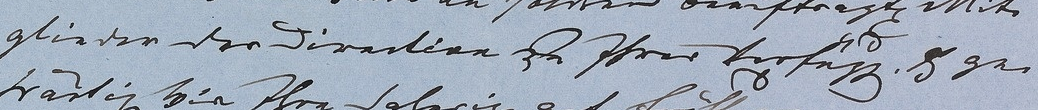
glieder der Direction zu Ihrer Verfügg. & ge-
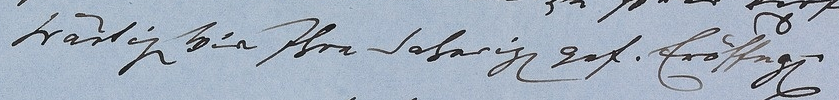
wärtigen wir Ihre daherigen gef. Eröffngen.
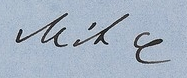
Mit & &
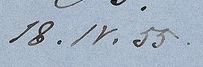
18. IV. 55.
